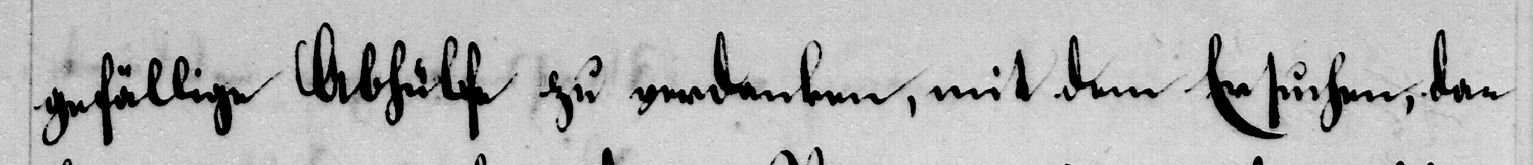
gefällige Abhülfe zu verdanken, mit dem Ersuchen, da¬
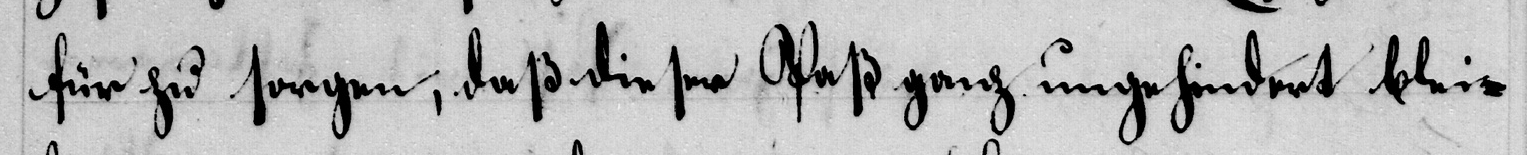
für zu sorgen, daß dieser Paß ganz ungehindert blei¬
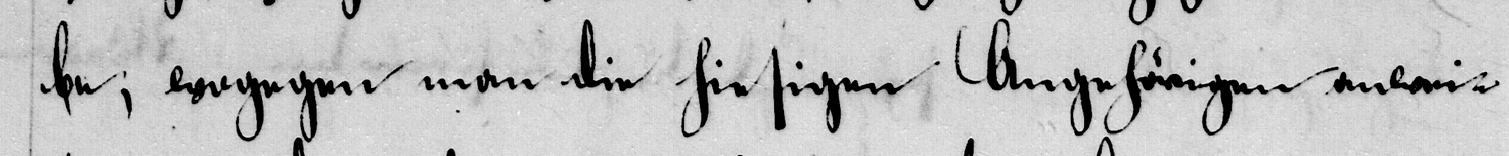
be, wogegen man die hiesigen Angehörigen anwei¬
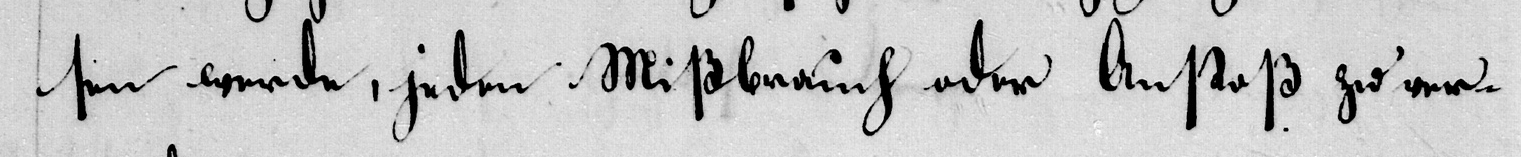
sen werde, jeden Mißbrauch oder Anstoß zu ver¬
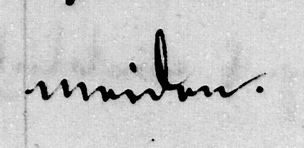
meiden.
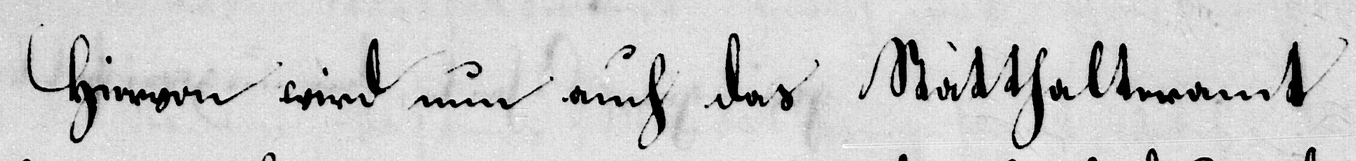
Hiervon wird nun auch das Statthalteramt
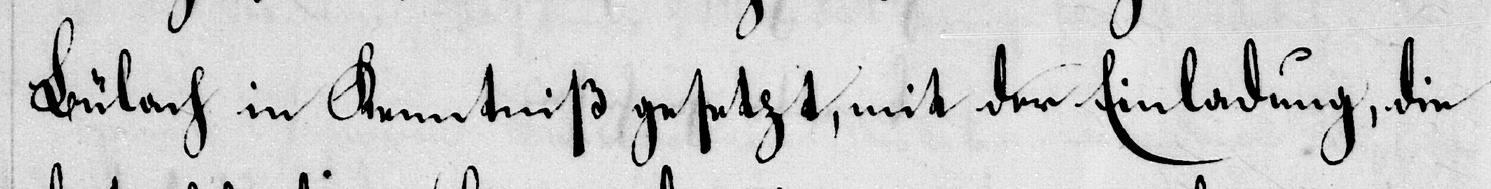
Bülach in Kenntniß gesetzt, mit der Einladung, die
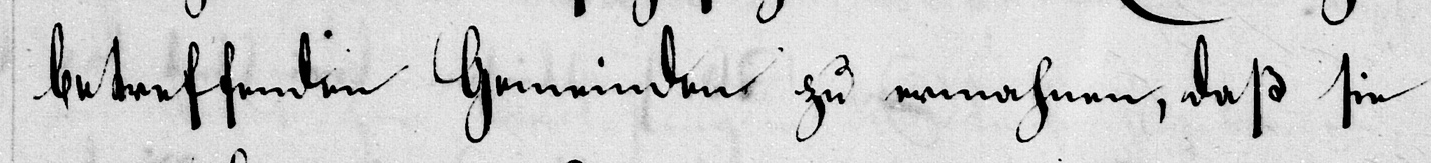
betreffenden Gemeinden zu ermahnen, daß sie
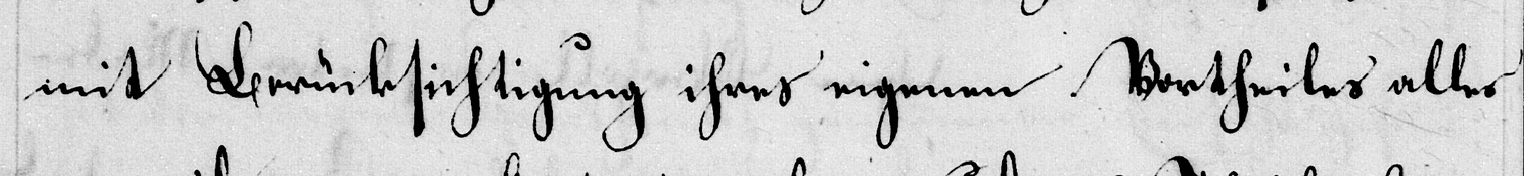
mit Berücksichtigung ihres eigenen Vortheiles alles
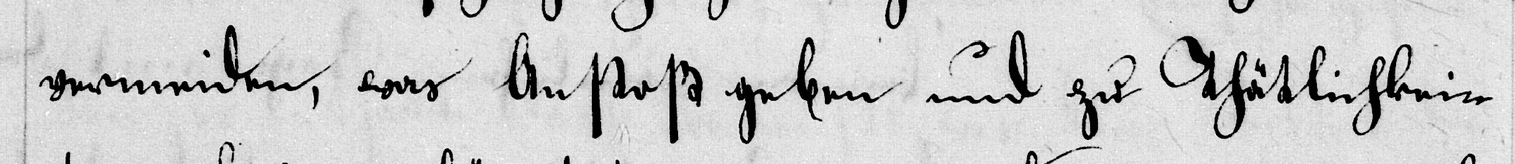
vermeiden, was Anstoß geben und zu Thätlichkei¬
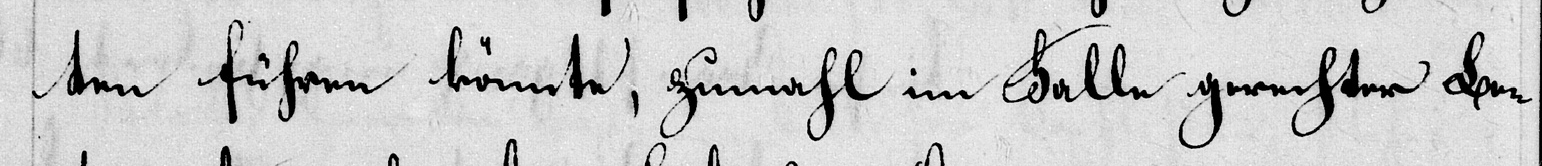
ten führen könnte, zumahl im Falle gerechter Be¬
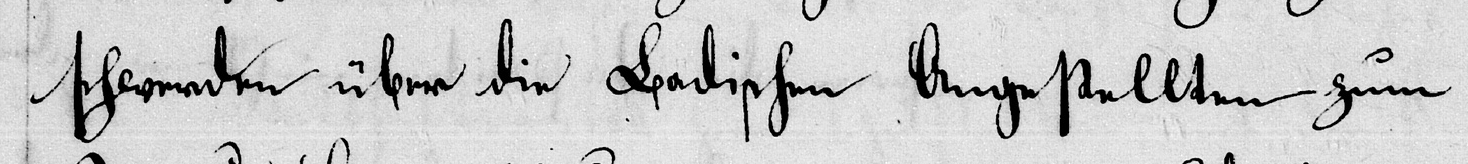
schwerden über die Badischen Angestellten zum
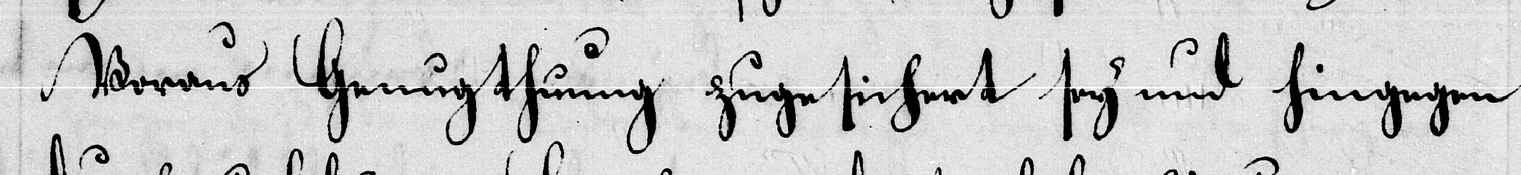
Voraus Genugthuung zugesichert sey und hingegen
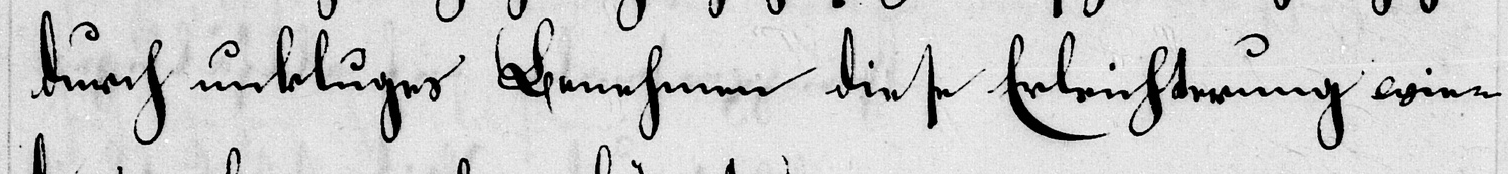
durch unkluges Benehmen diese Erleichterung wie¬
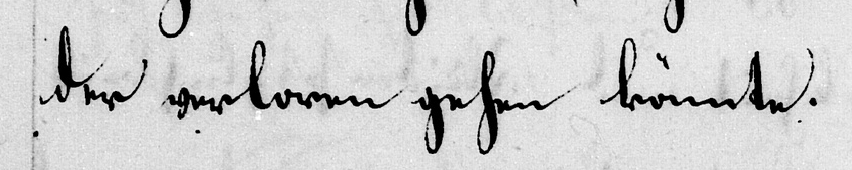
der verloren gehen könnte.
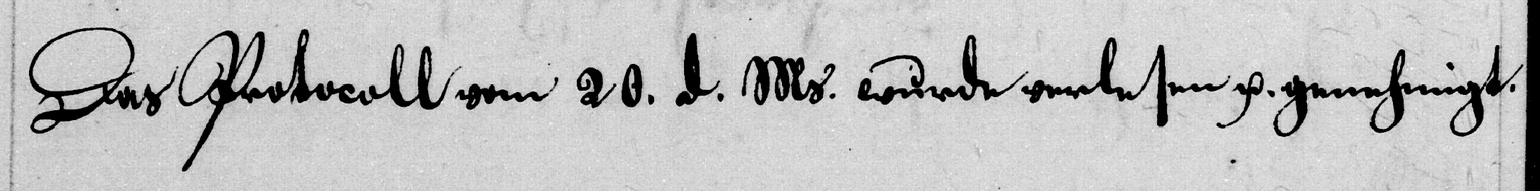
Das Protocoll vom 20. d. Ms. wurde verlesen u. genehmigt.
